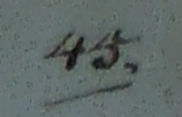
45.
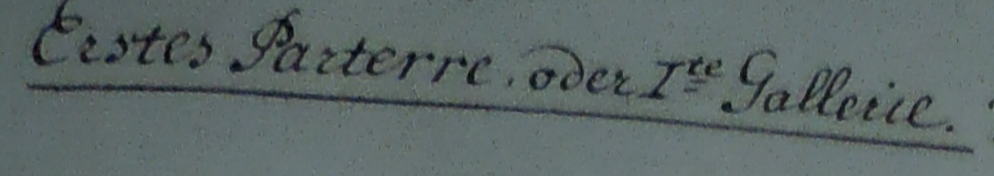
Erstes Parterre, oder It͇e Gallerie.
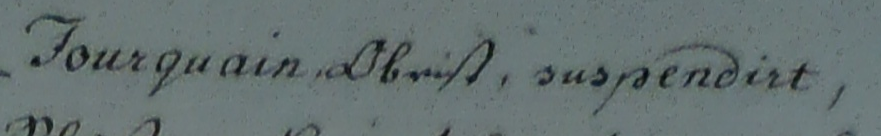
Fourquain, Obrist, suspendirt,
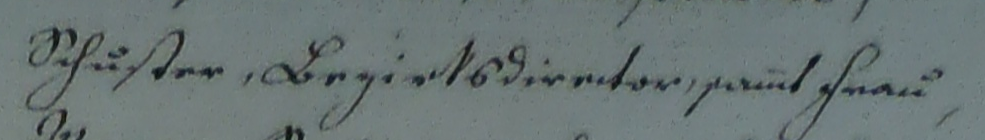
Schuster, Bezirksdirektor, sam̅t Frau,
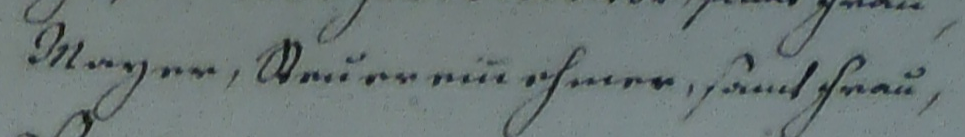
Mayer, Steuerein̅ehmer, samt Frau,
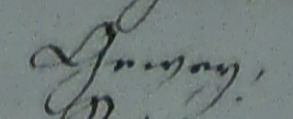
Gewey,
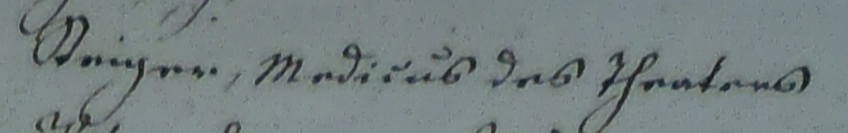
Steiger, Medicus des Theaters
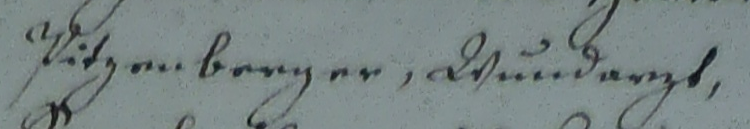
Pitzenberger, Wundarzt,
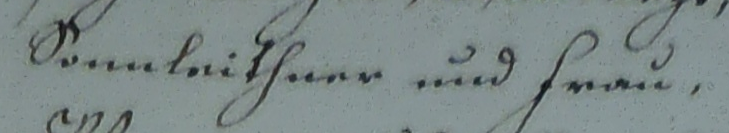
Sonnleithner und Frau,
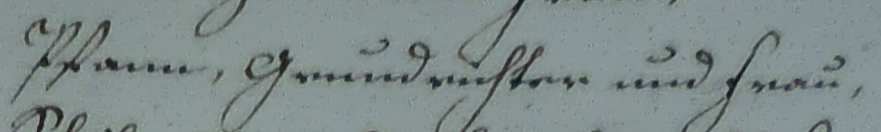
Pfann, Grundrichter und Frau,
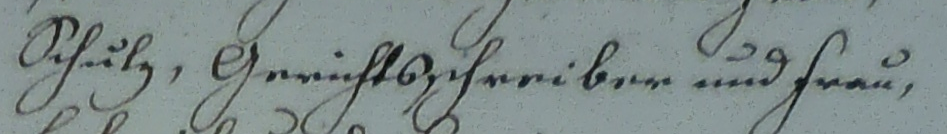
Schulz, Gerichtsschreiber und Frau,
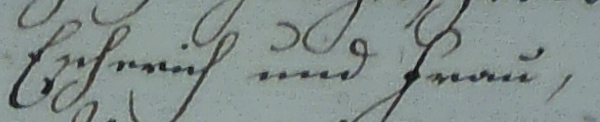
Escherich und Frau,
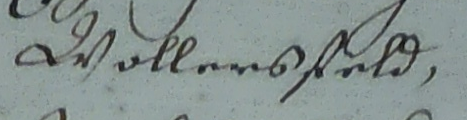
Wollersfeld,
